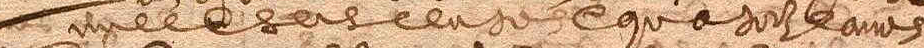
mill e seiscentos e quatorze anos
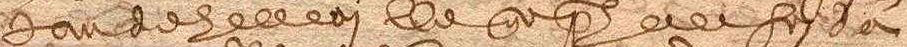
tando helle aj llogo pō elle foy da
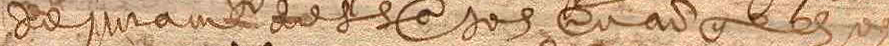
do juramto dos sātos euaõgelhos
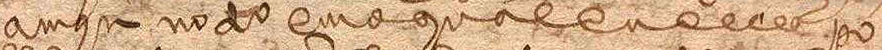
a mjn notro em o qual eu e elle po
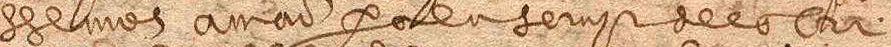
ssemos a maõ ꝑa eu serujr de escri
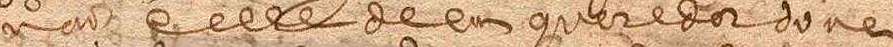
uaõ e elle de emqueredor do ne
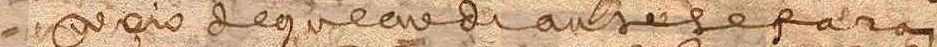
gocio de que em diante se fara
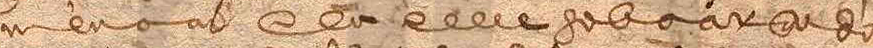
mençaõ e eu e elle sob cargo do
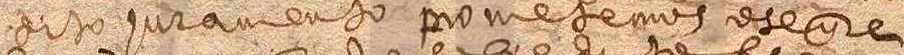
dito juramento prometemos o segre
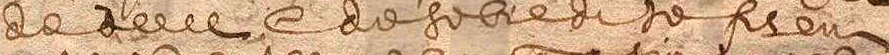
do delle e do sobredito fis eu
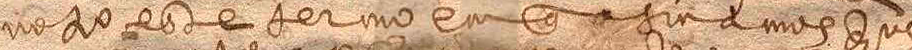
notro este termo em q̄ asinamos dos
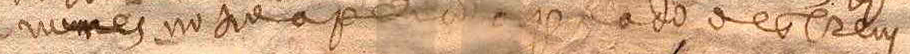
nunes notro apllicō aꝓuado o escreuj
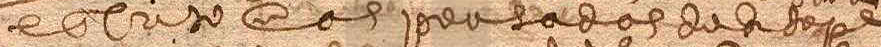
escrito ē as pousadas do dito pe
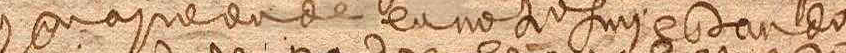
ujguajro onde eu notro fuj estando
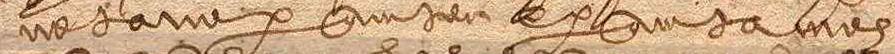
notario ꝑguntou e ꝑguntamos
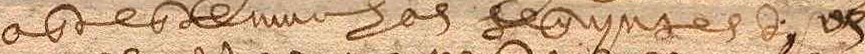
as testemunhas segujntes dos
